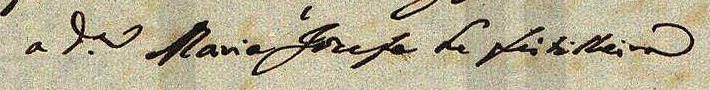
a d.a Maria Jozefa he feitisseira
